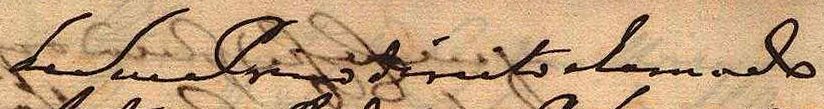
de Seu Primo direito chamado
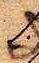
L.
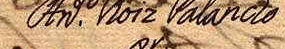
An.to Rōiz Palancho
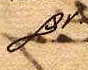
Pr.
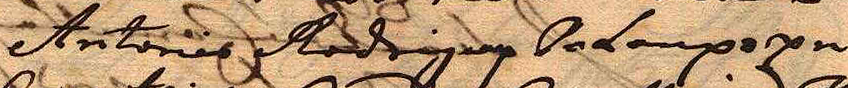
Antonio Rodrigues PaLanxo xn
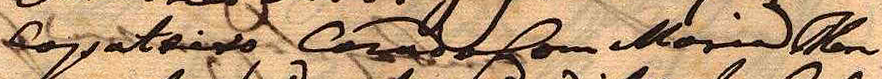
capateiro Cazado Com Maria Men
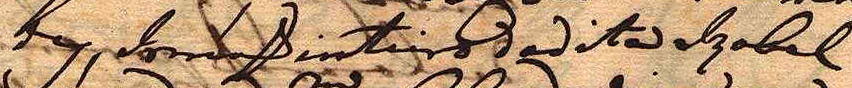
des, Irmaõ inteiro da dita Izabel
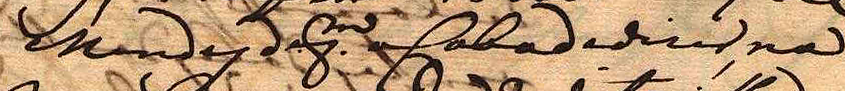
Mendes de q.m aCaba de dizer, na
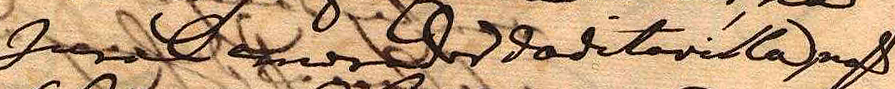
tural e morador da dita villa naõ
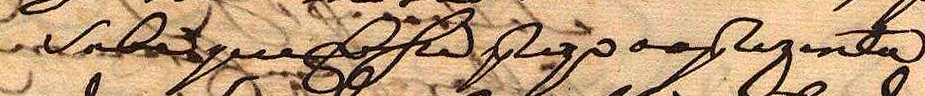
sabe que fosse prezo o apRezenta
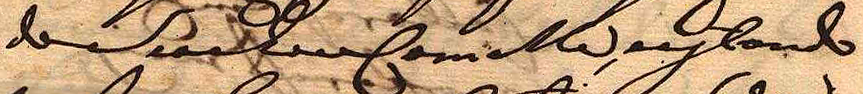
do Se achou Com elle, e estando
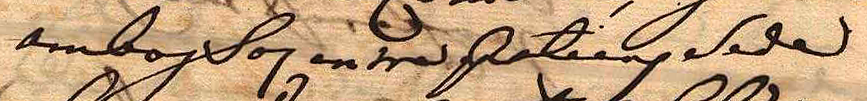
ambos Sos entre praticas se de
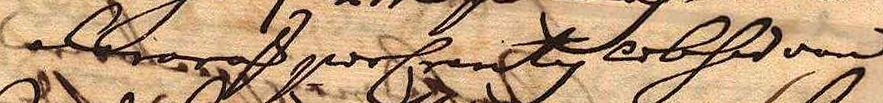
clararaõ por Crentes e observan
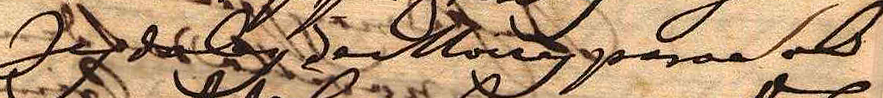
tes da Ley de Moizes para Sal
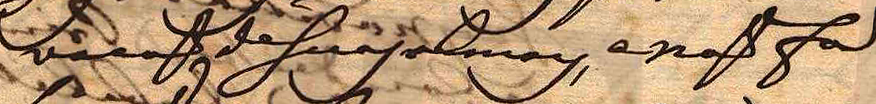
vaçaõ de suas almas, e naõ fa
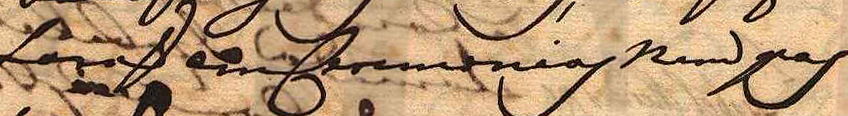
Laraõ em Ceremonias nem pas
